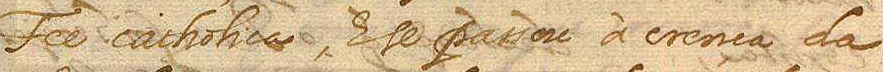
Fee catholica, E se passou à crença da
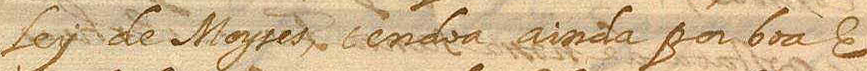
Ley de Moyses, tendoa ainda por boa E
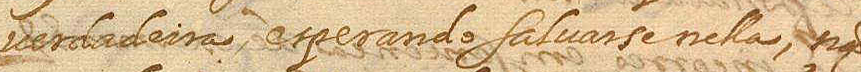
uerdadeira, esperando saluarse nella, naõ
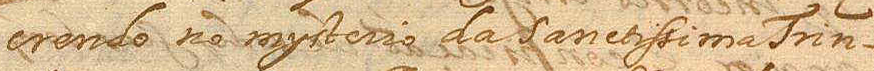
crendo no mysterio da Sanctissima Trin
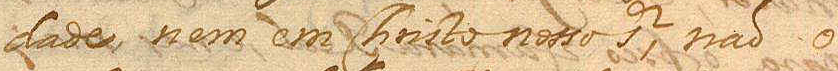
dade nem em Christo nosso sor, naõ o
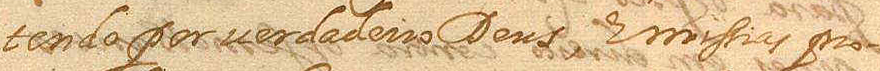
tendo por uerdadeiro Deus, E missias pro
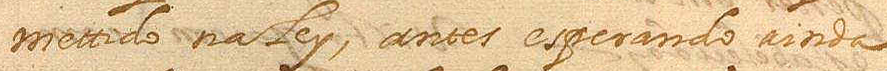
mettido na Ley, antes esperando ainda
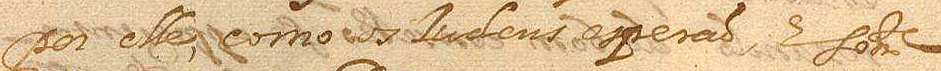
por elle, como os Iudeus esperaõ, E somte
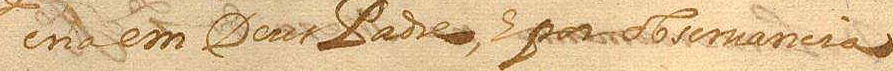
cria em Deus Padre, E por obseruancia
